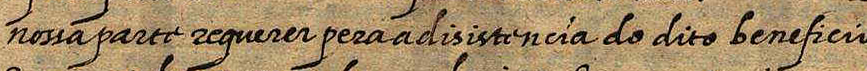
nossa parte requerer pera a disistencia do dito beneficio
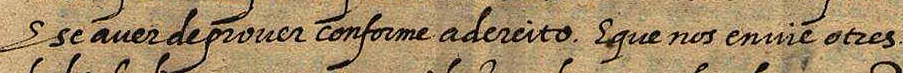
E se auer de prouer conforme a dereito. E que nos enuie o tres
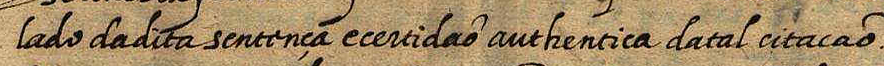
lado da dita sentença e certidaõ authentica da tal citaçaõ.
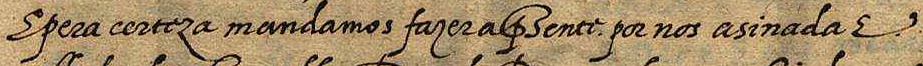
E pera certeza mandamos fazer a p̄sente por nos asinada E
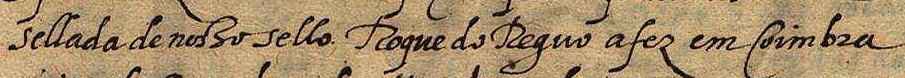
sellada de nosso sello. Roque do Reguo a fez em Coimbra
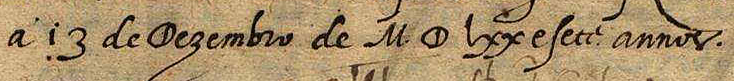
a i3 de Dezembro de M. D lxx e sete annos.
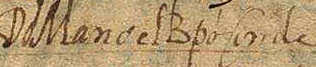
Dō Manoel Bpō Conde
